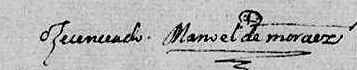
o Lecenceado Manoel de moraez
